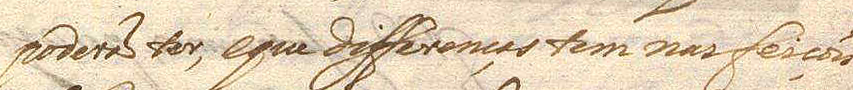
poderaõ ter, e que differenças tem nas feiçoēs
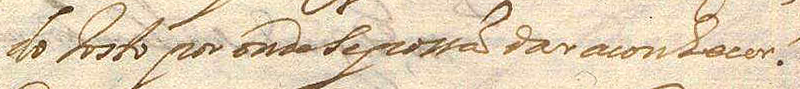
do Rosto por onde se possaõ dar a conhecer?
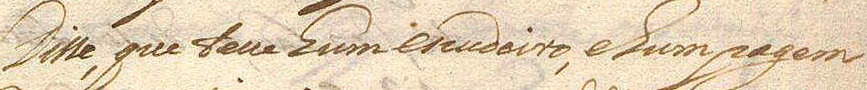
Disse, que teue hum escudeiro, e hum pagem
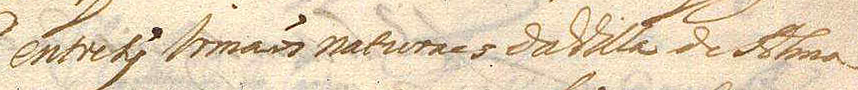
entre sy Irmaõs naturaes da Villa de Alma
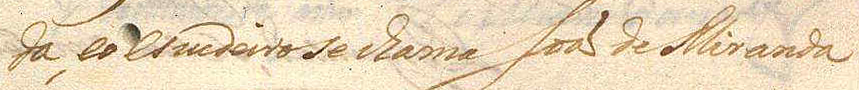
da, e o escudeiro se chama Joaõ de Miranda
